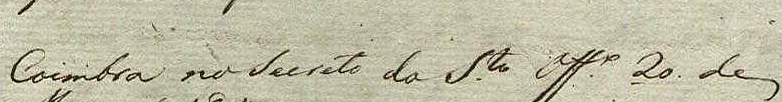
Coimbra no Secreto do S.to Off.o 20. de
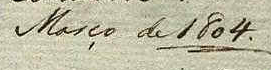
Março de 1804.
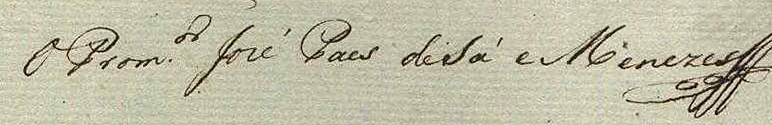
O Prom.or Jozé Paes de Sá e Menezes
